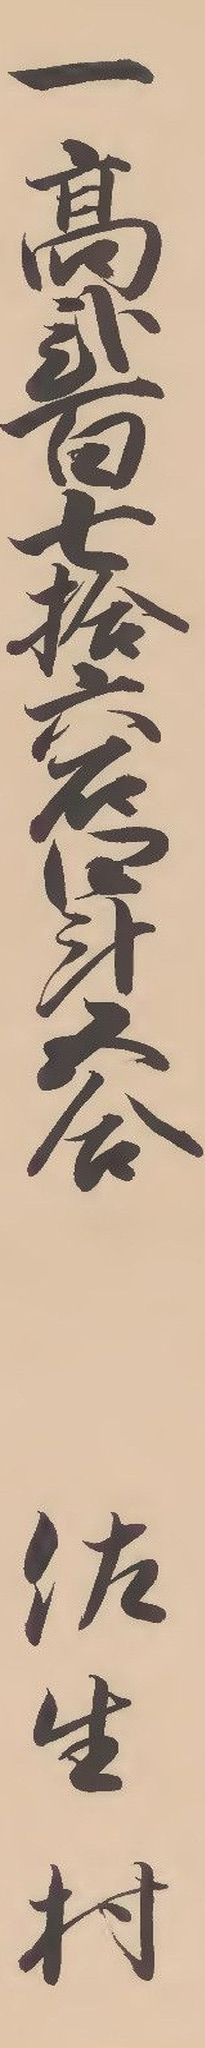一高弐百七拾六石四斗五合佐生村
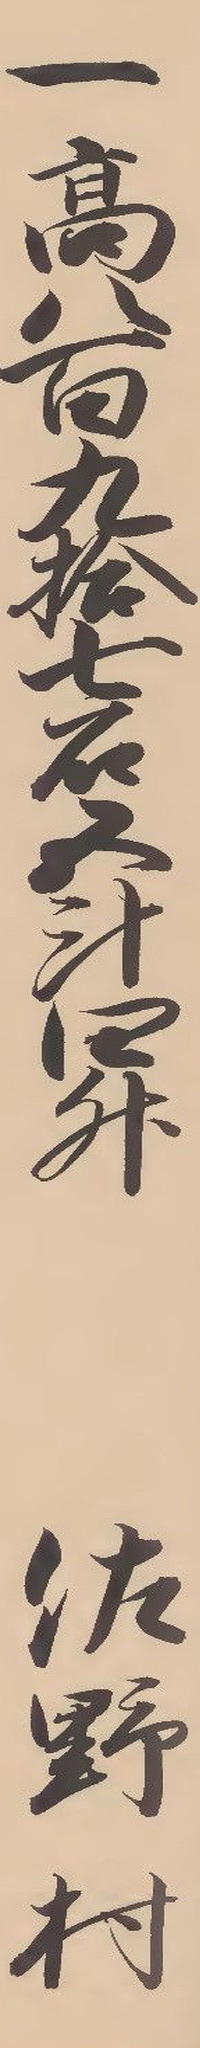一高八百九拾七石五斗四升佐野村
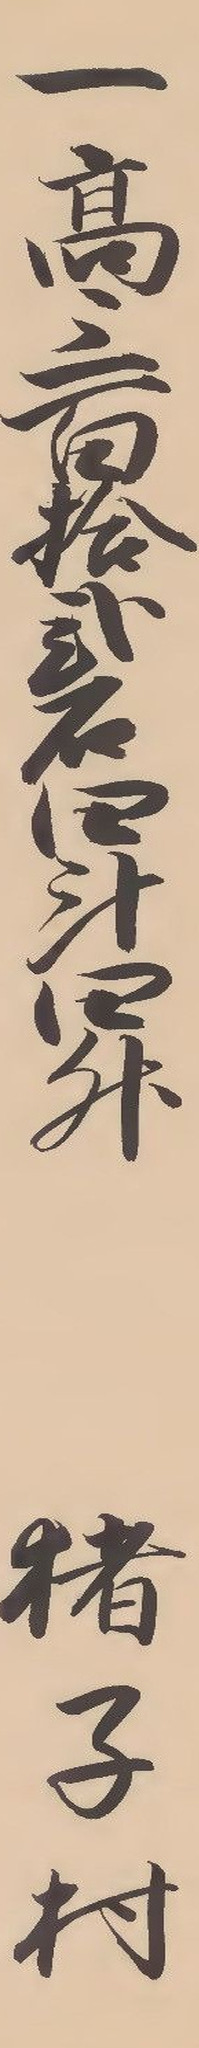一高三百拾弐石四斗四升猪子村
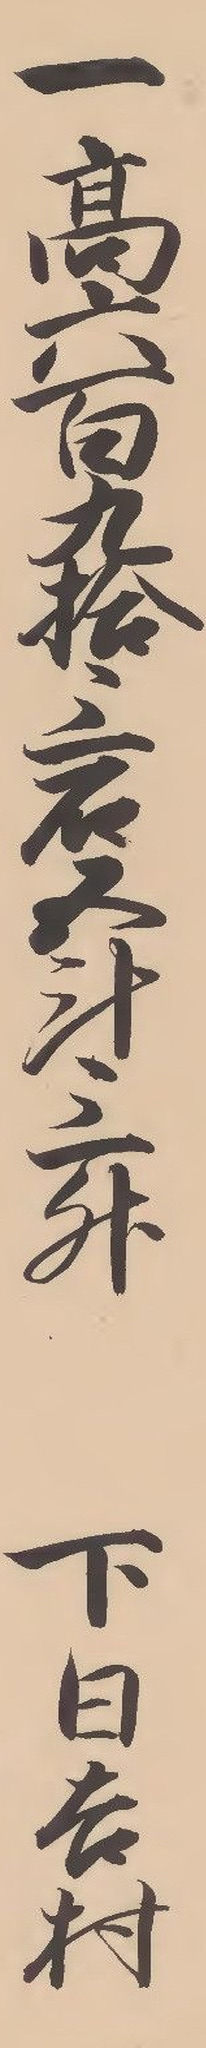一高六百九拾三石五斗三升下日吉村
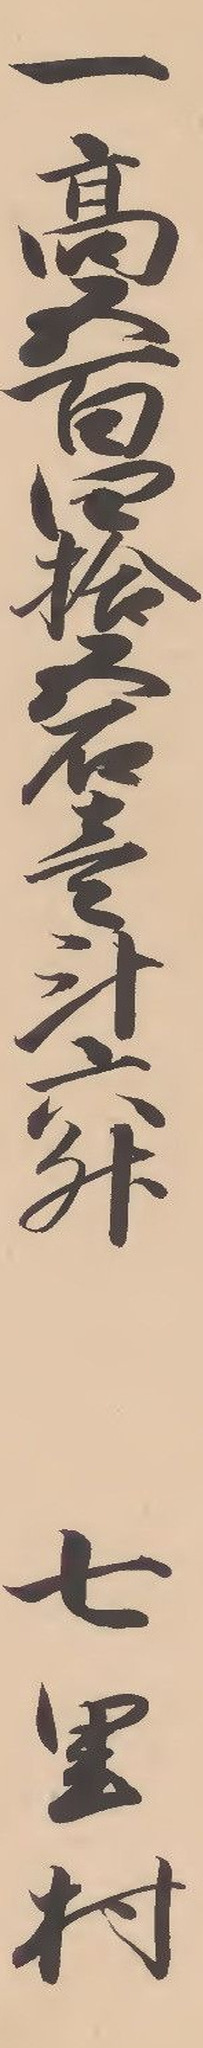一高五百四拾五石壱斗六升七里村

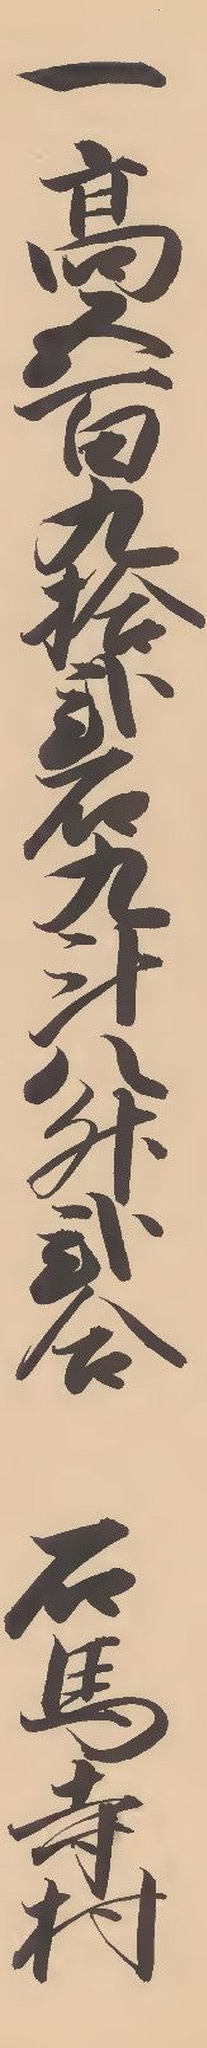一高五百九拾弐石九斗八升弐合石馬寺村
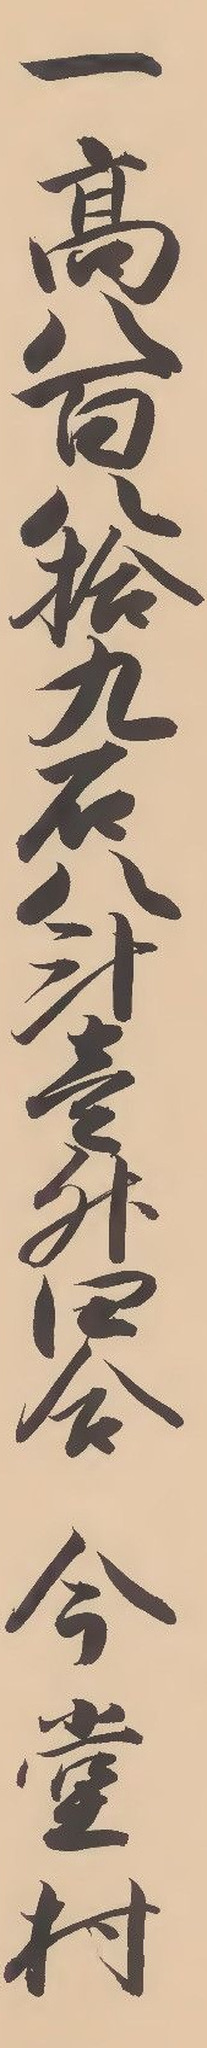一高八百八拾九石八斗壱升四合今堂村
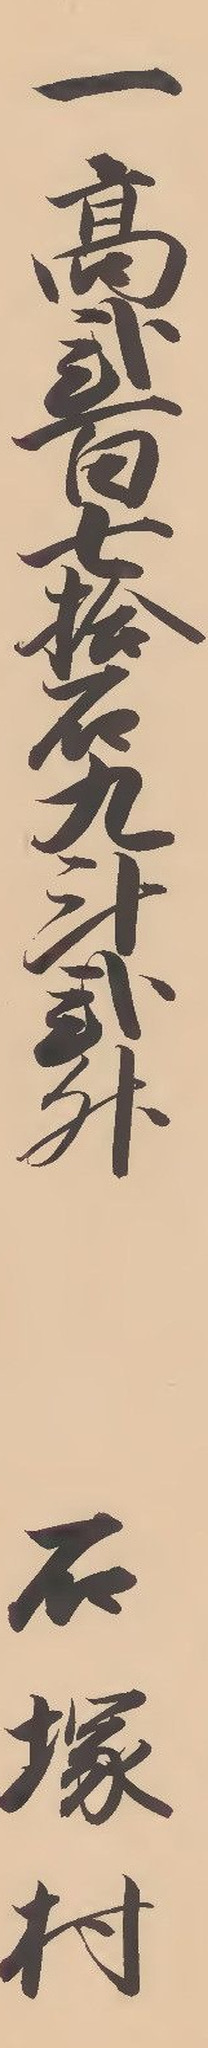一高弐百七拾石九斗弐升石塚村
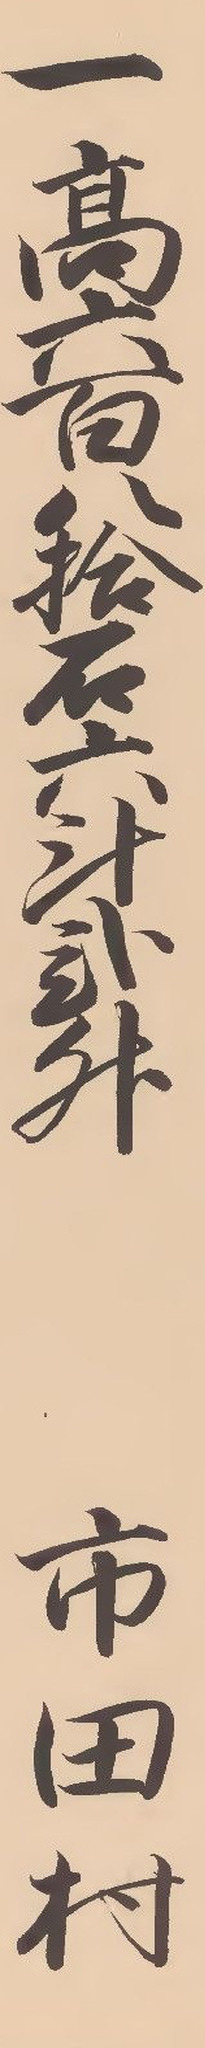一高六百八拾石六斗弐升市田村
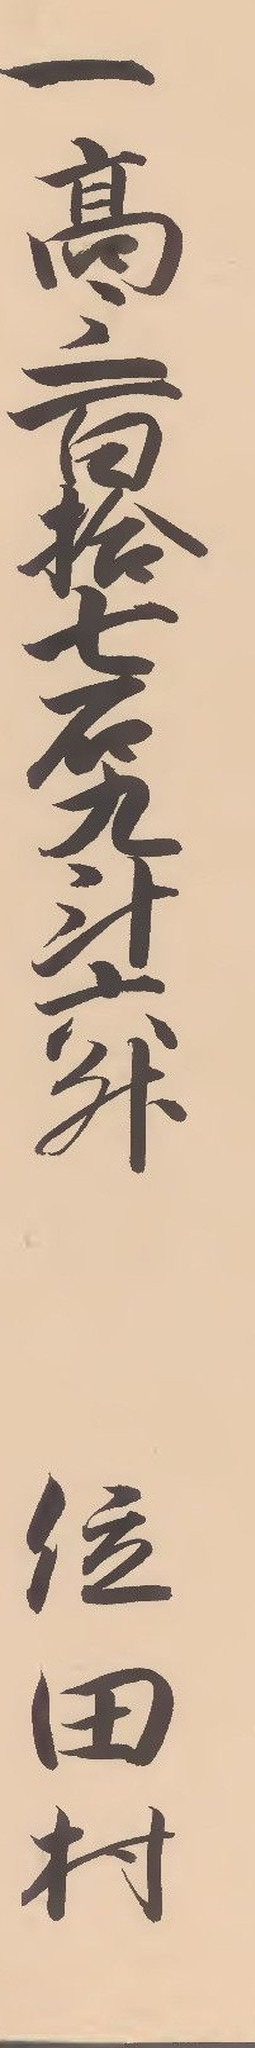一高三百拾七石九斗六升位田村
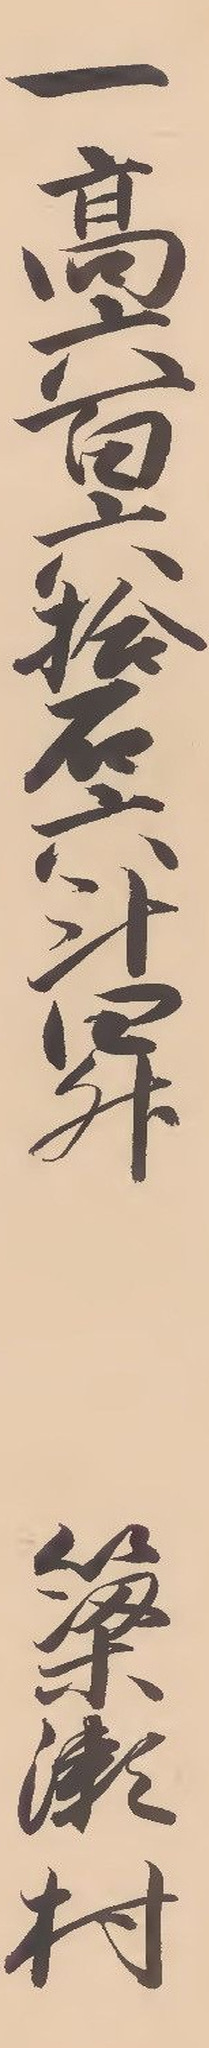一高六百六拾石六斗四升簗瀬村
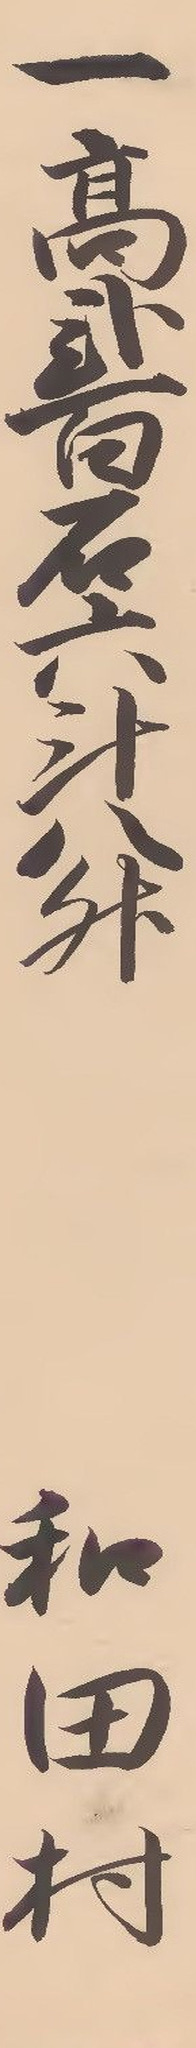一高弐百石六斗八升和田村

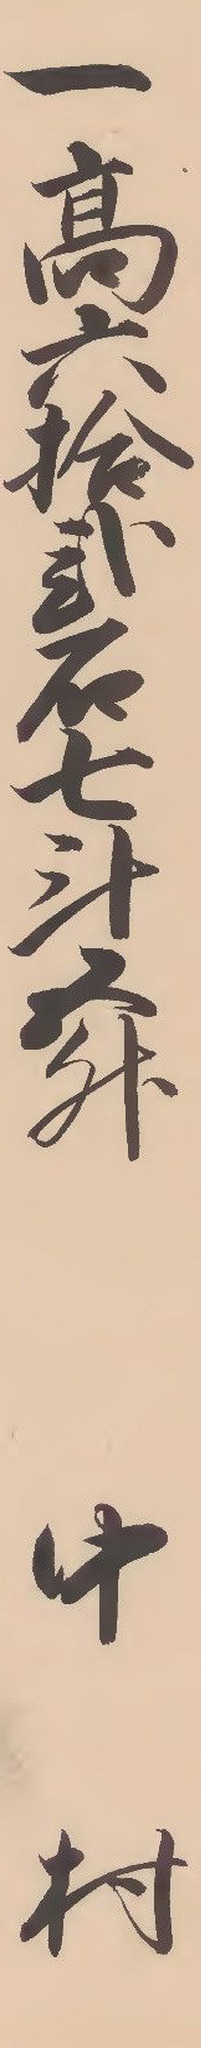一高六拾弐石七斗五升中村
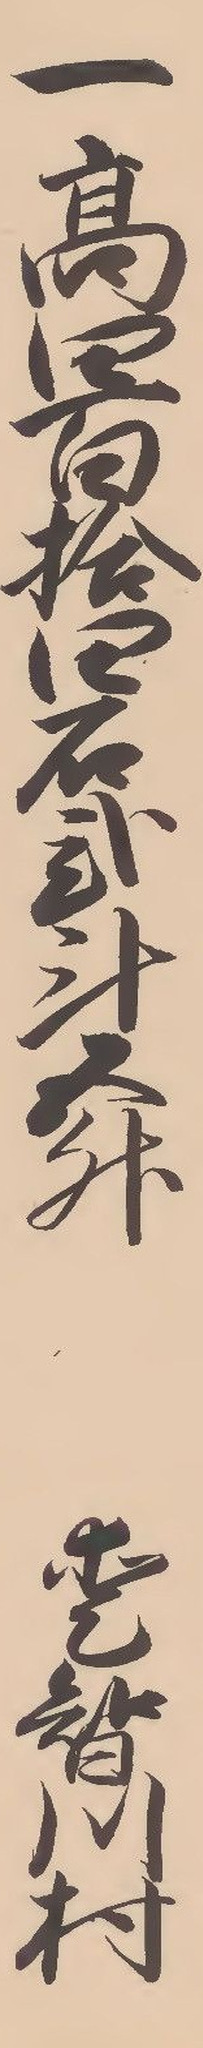一高四百拾四石弐斗五升愛智川村
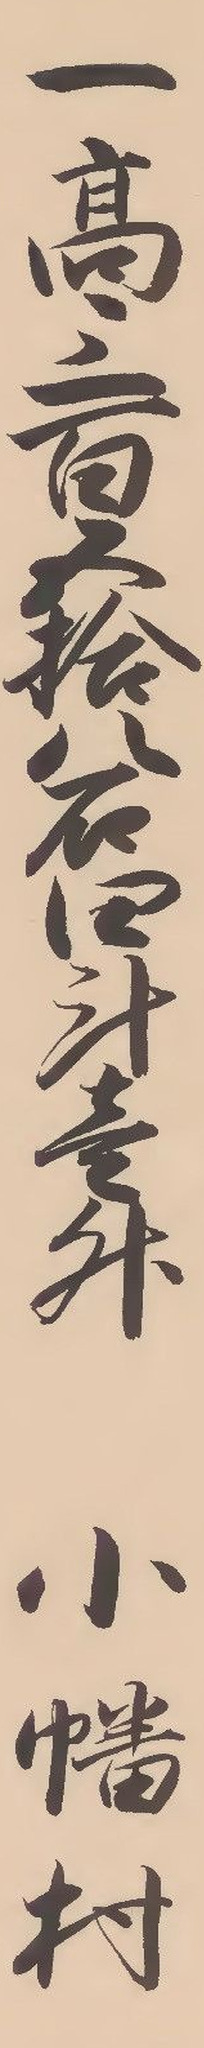一高三百五拾八石四斗壱升小幡村
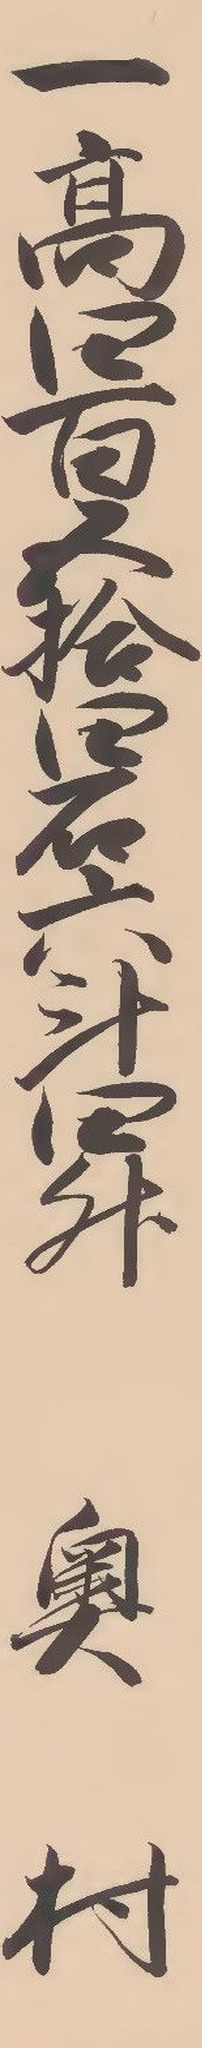一高四百五拾四石六斗四升奥村
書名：近江国郷帳
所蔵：国立公文書館 National Archives of Japan
